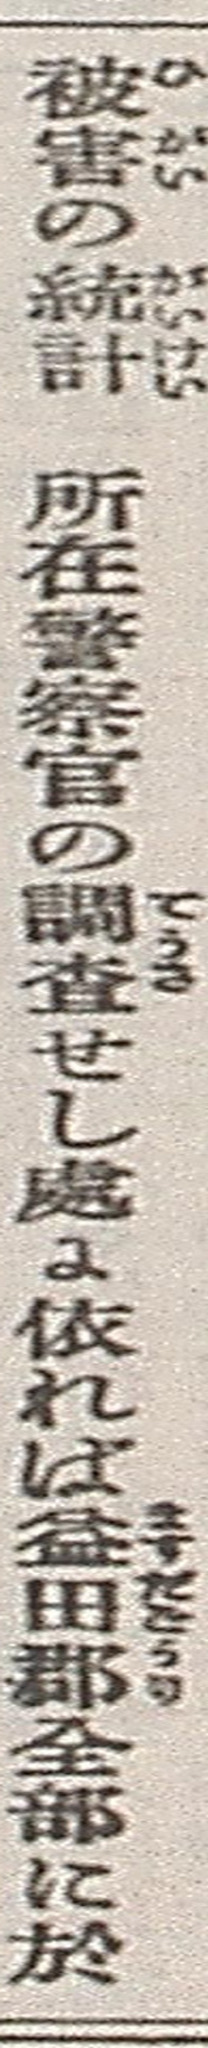被害の統計所在警察官の調査せし処に依れば益田郡全部に於
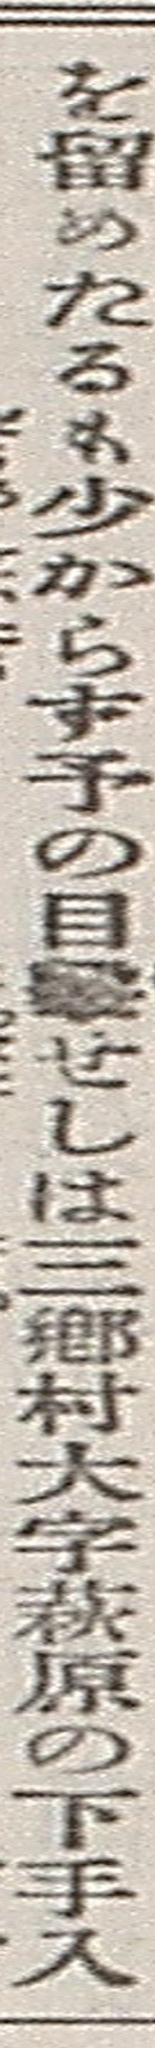を留めたるも少からず予の目撃せしは三郷村大字萩原の下手入
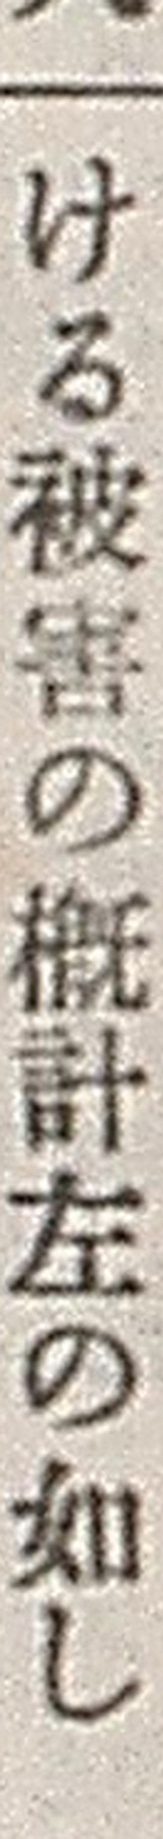ける被害の概計左の如し
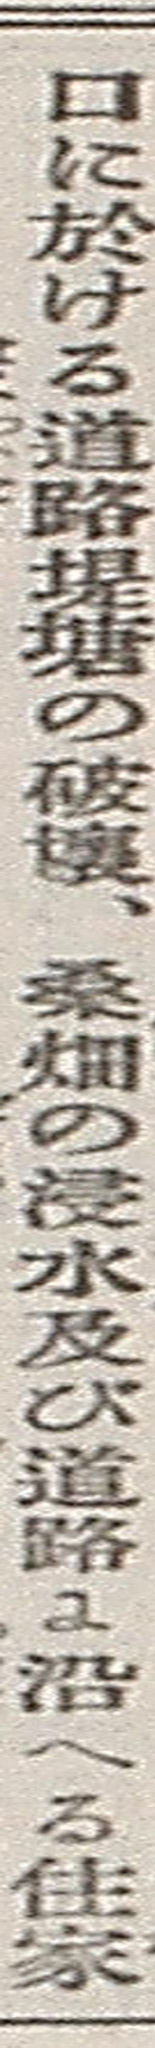口に於ける道路堤塘の破壊、桑畑の浸水及び道路に沿へる住家
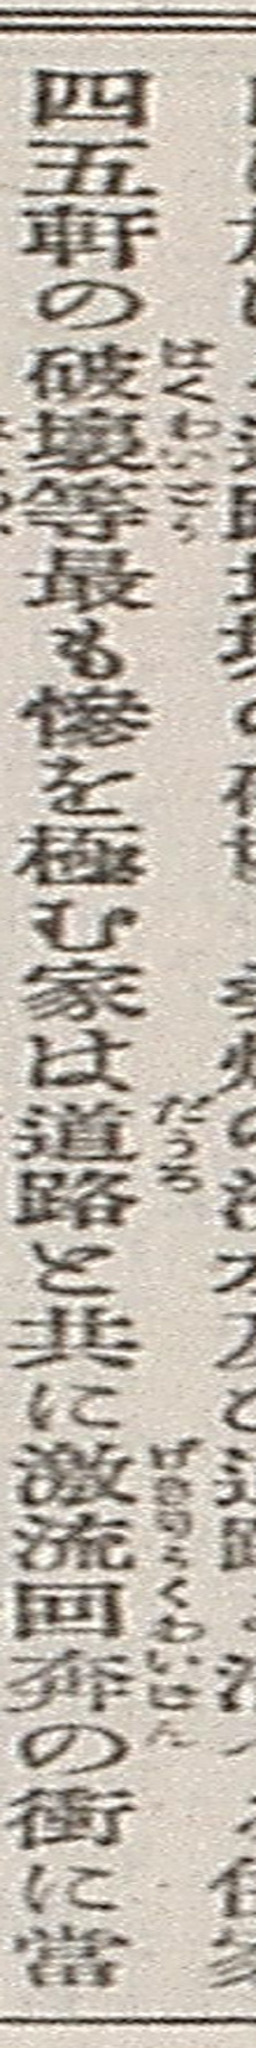四五軒の破壊等最も惨を極む家は道路と共に激流回奔の衝に当
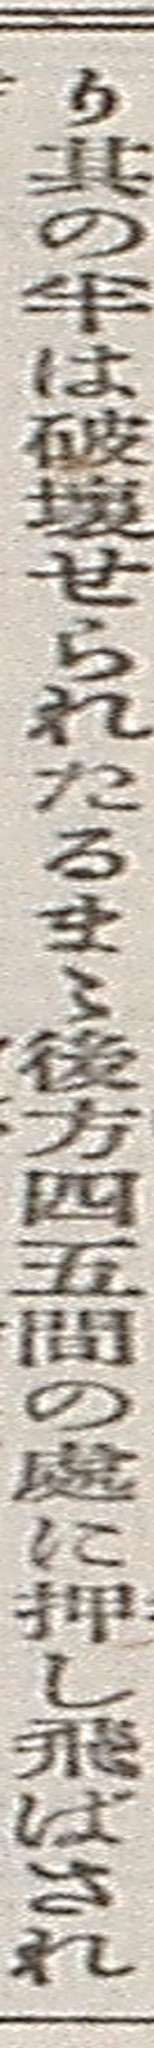り其の半は破壊せられたるまゝ後方四五間の処に押し飛ばされ
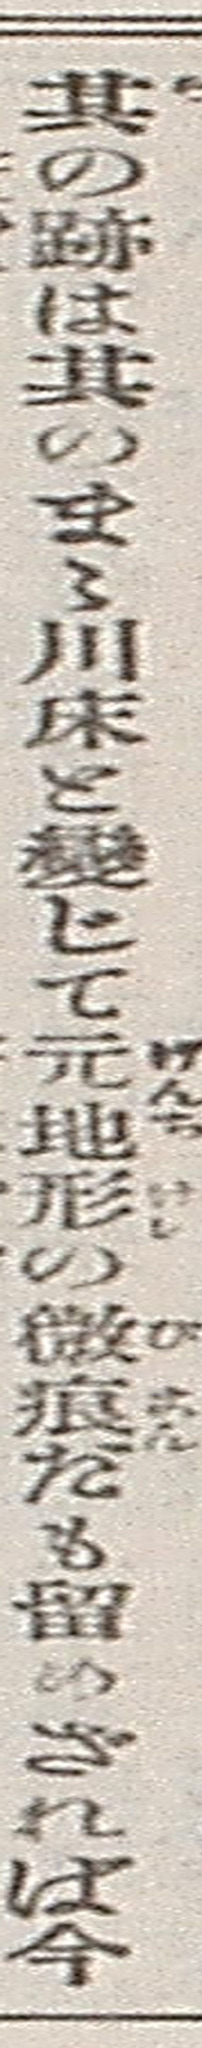其の跡は其のまゝ川床と変じて元地形の微痕だも留めざれば今
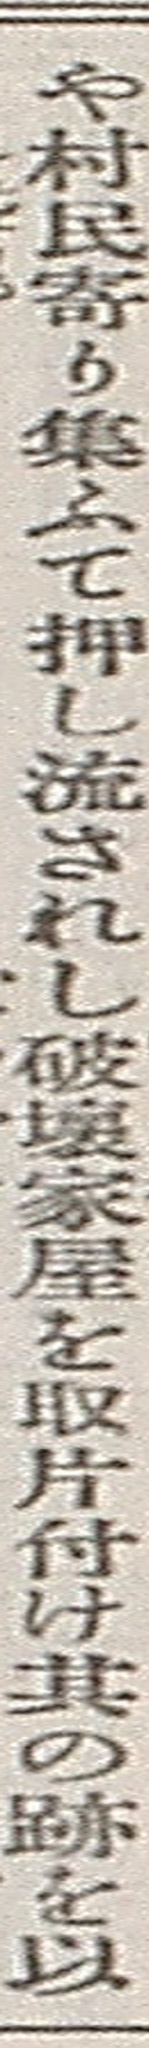や村民寄り集ふて押し流されし破壊家屋を取片付け其の跡を以
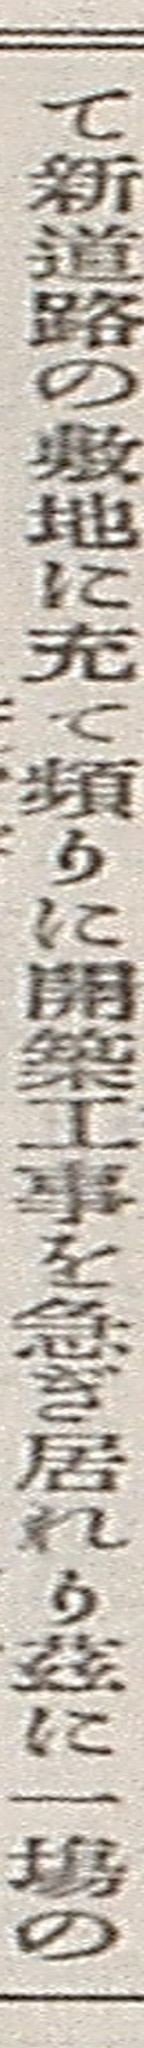て新道路の敷地に充て頻りに開築工事を急ぎ居れり茲に一場の
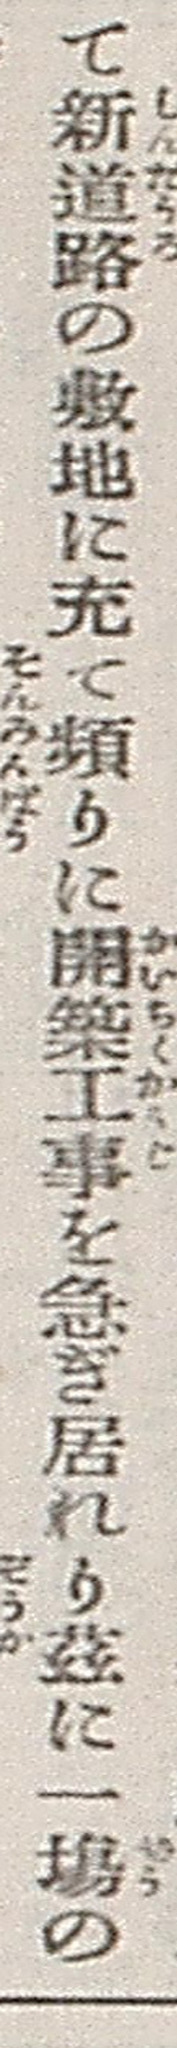て新道路の敷地に充て頻りに開築工事を急ぎ居れり茲に一場の
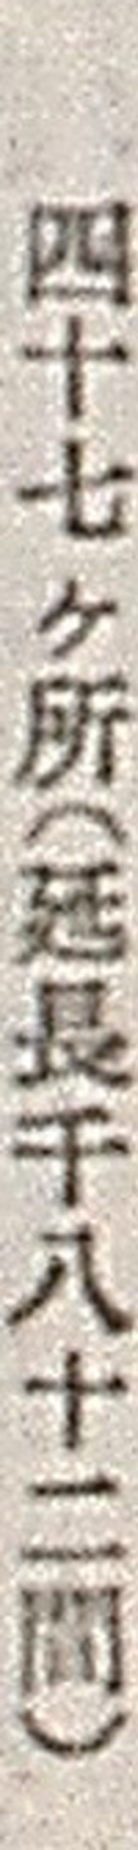同欠損四十七ヶ所千八十二間
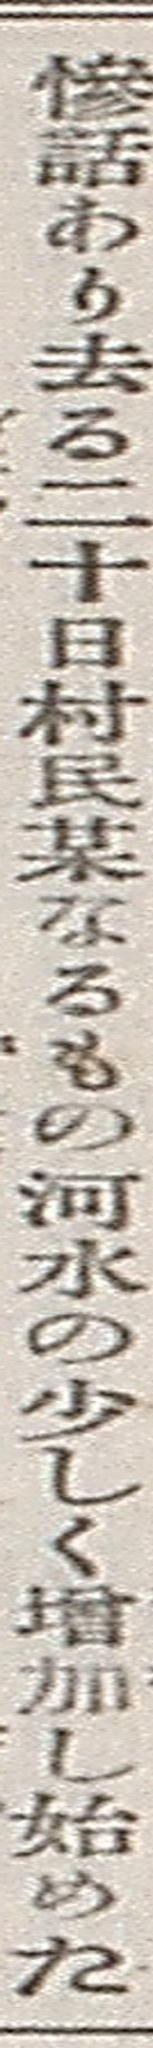惨話あり去る二十日村民某なるもの河水の少しく増加し始めた
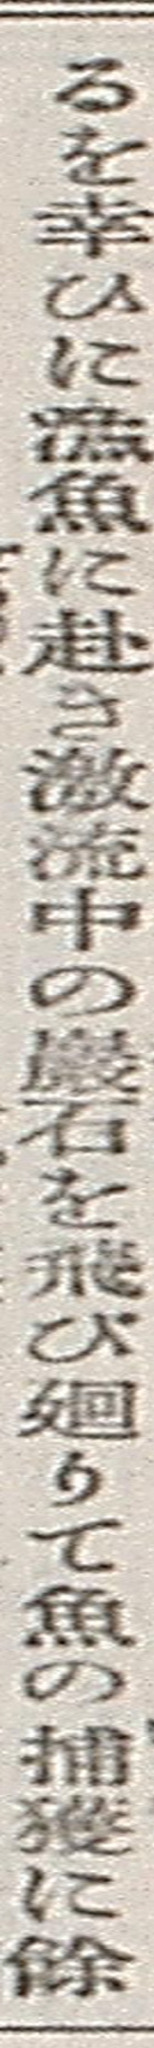るを幸ひに漁魚に赴き激流中の巌石を飛び廻りて魚の捕獲に餘
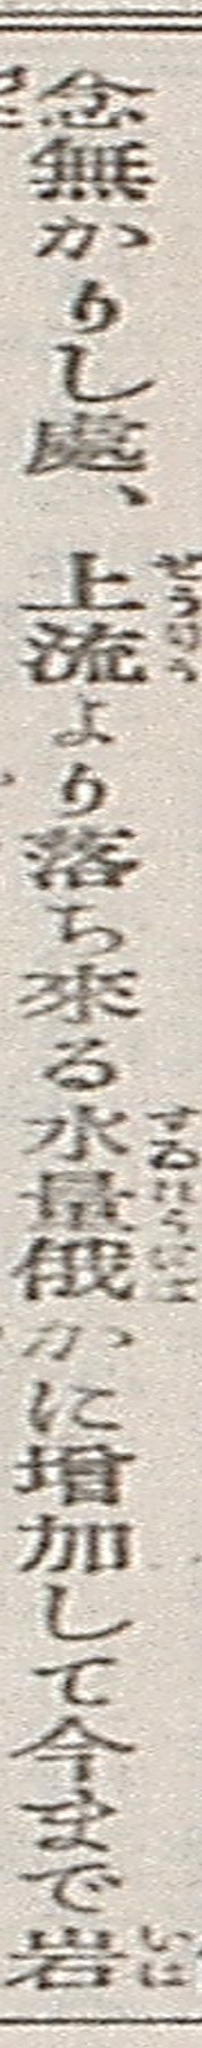念無かりし処、上流より落ち来る水量俄かに増加して今まで岩
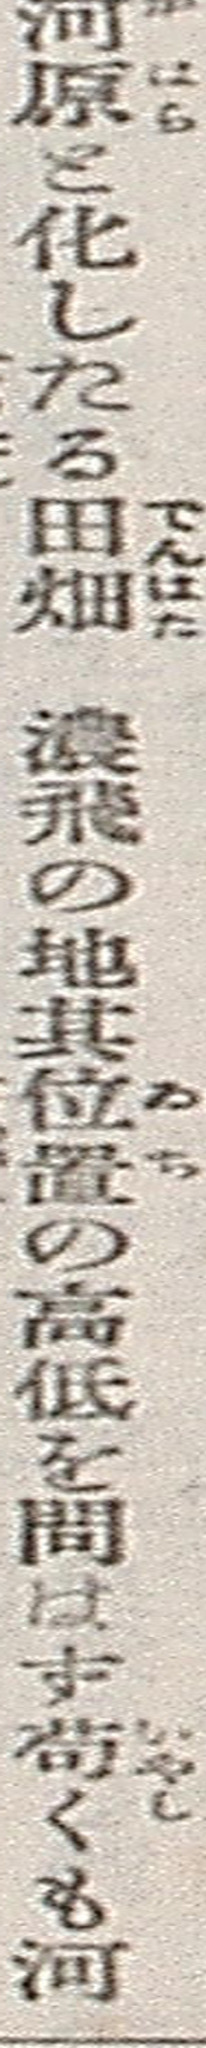河原と化したる田畑濃飛の地其位置の高低を問はず苟くも河
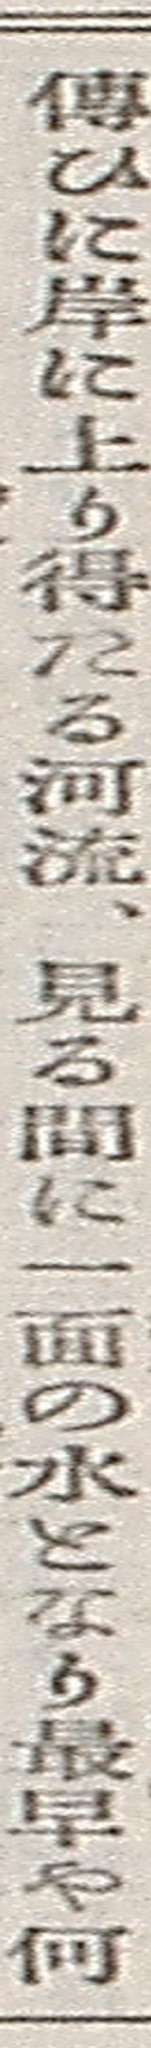伝ひに岸に上り得たる河流、見る間に一面の水となり最早や何
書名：風俗畫報臨時増刊第百二十八號　洪水被害録（下）
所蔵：東京大学地震研究所図書室 Earthquake Research Institute Library, The University of Tokyo, JAPAN
